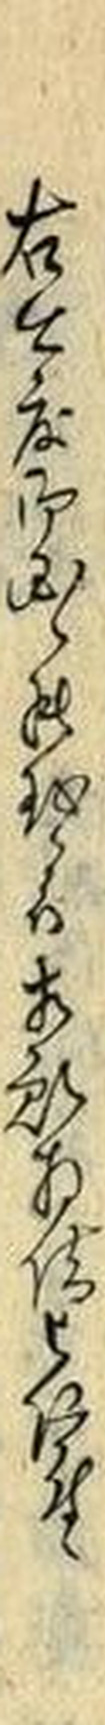右今度御国へ罷越候ニ付相願拝借被仰付候
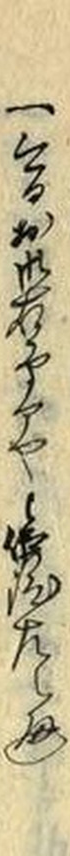一今日於御右筆部や被仰渡左之通
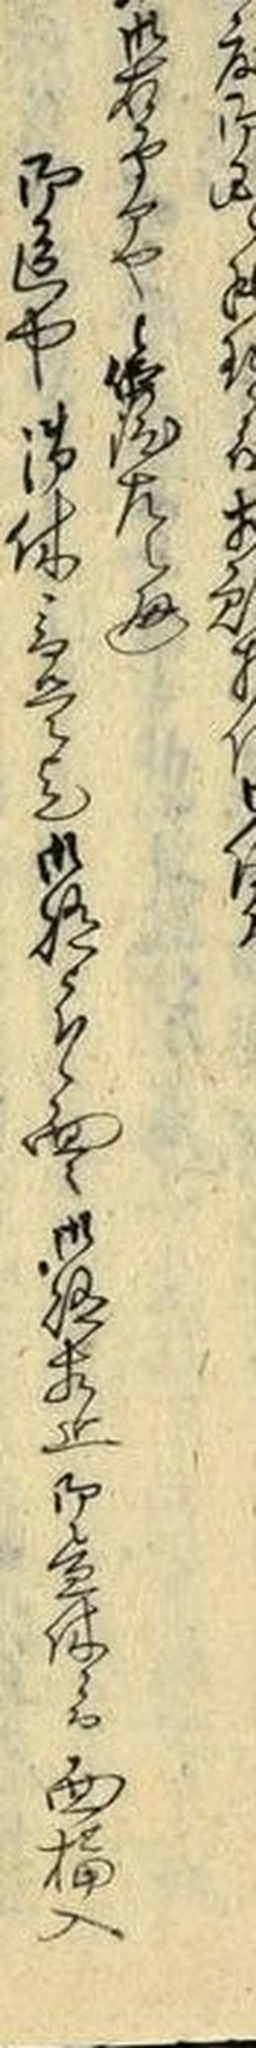御道中御休ニ而是迄御賄被下候面々御賄相止御昼休ニ而面桶入
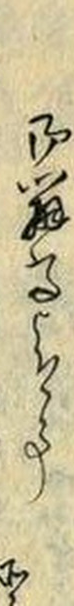御弁当被下候事
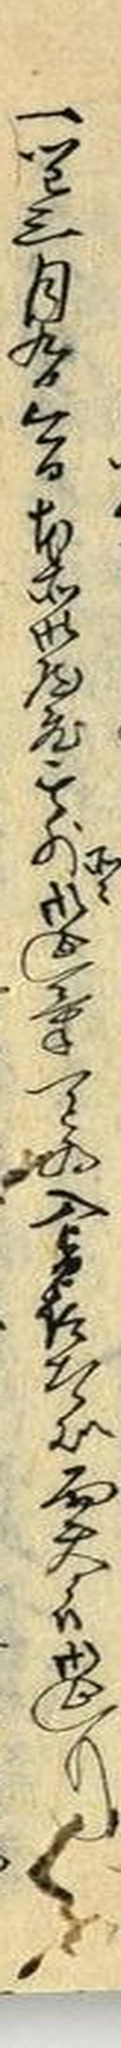一閏三月九日今日本所御屋敷其外所々御延気可被為入被仰出候処雨天ニ付御延引
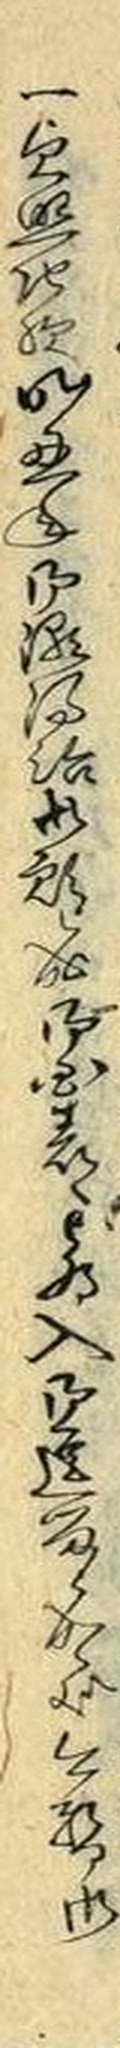一貞照院様昨丑年御漸湯治御願被成御国表へ被為入御逗留被成候処今暫御
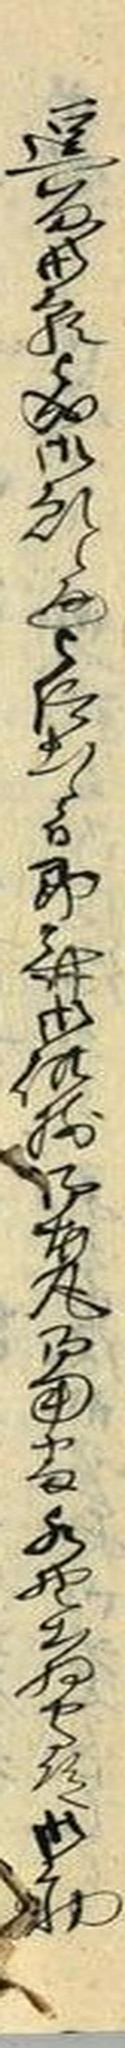逗留御願被成御願之通被仰出候ニ付即刻御供揃御本丸御用番水野出羽守殿へ御勤
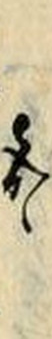被成候
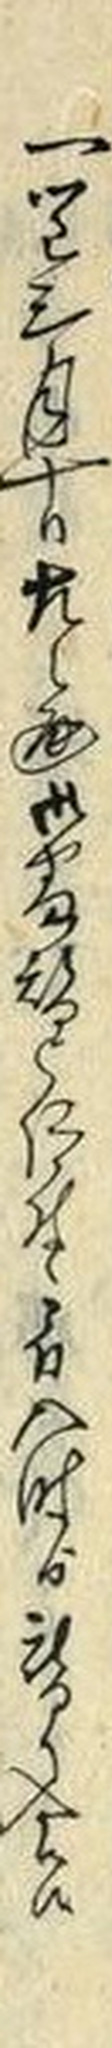一閏三月十日左之通御番替被仰付候ニ付八時ゟ替り合候
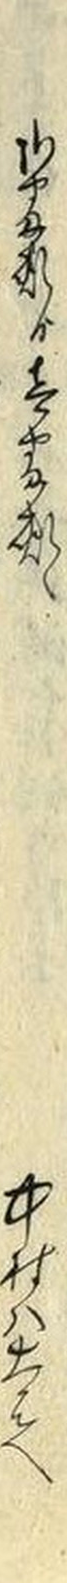弐番頬ゟ壱番頬へ中村八太夫
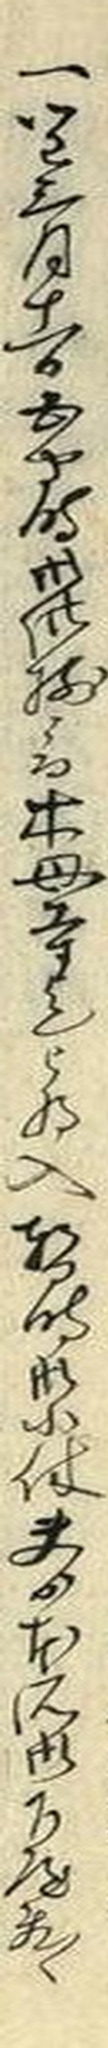一閏三月十一日五半時御供揃ニ而木母寺迄被為入暫時御小休夫ゟ本所御下屋敷へ
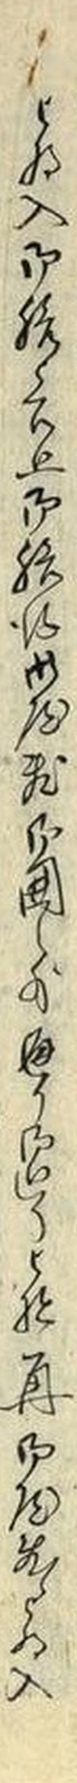被為入御膳被召上御膳後御屋敷御囲之外通り御廻り被遊再御屋敷へ被為入
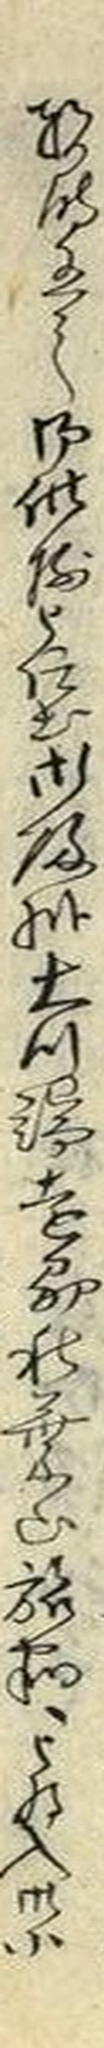暫時有之御供揃被仰出御帰掛大川端遠州秋葉山旅宿へ被為入御小
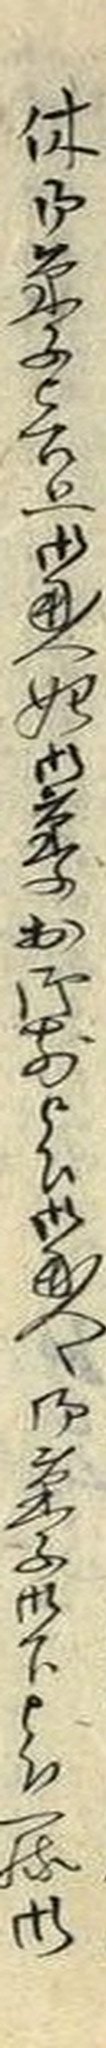休御菓子被召上御用人始御菓子於御前被下御用人へ御菓子御下被下一統御
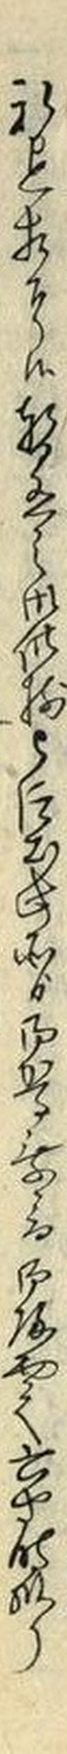礼申上相下り候暫有之御供揃被仰出此所ゟ御駕乗ニ而御帰殿六半時掛り
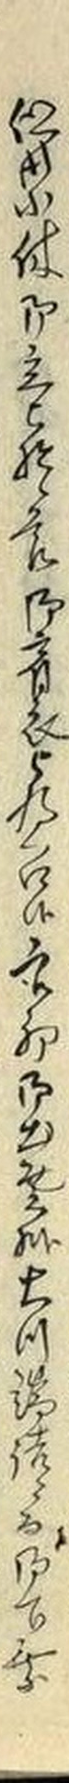但御小休御立被遊候節御肩衣被為召候最初御出殿掛大川端詰ニ而御下乗
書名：少傅日録抄（斉承付側向頭取日記、在府）
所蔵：福井県文書館 Fukui Prefectural Archives
